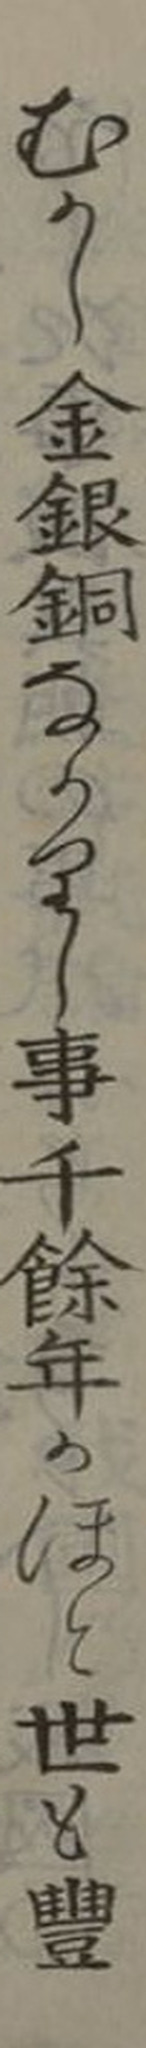むかし金銀銅なかりし事千餘年のほと世も豐
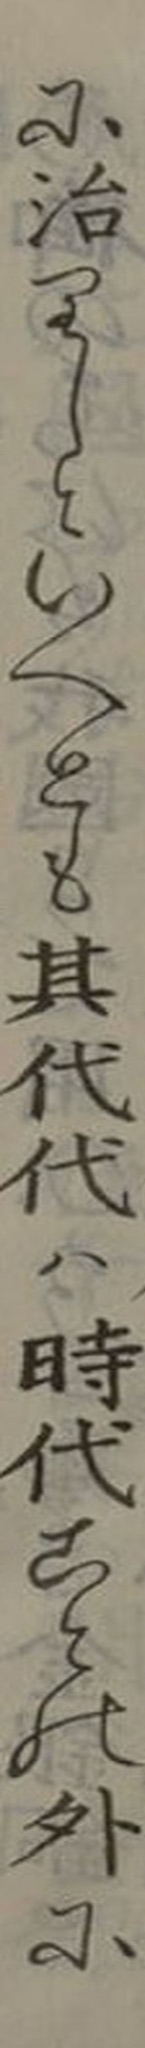に治りしといへとも其代代は時代ことの外に
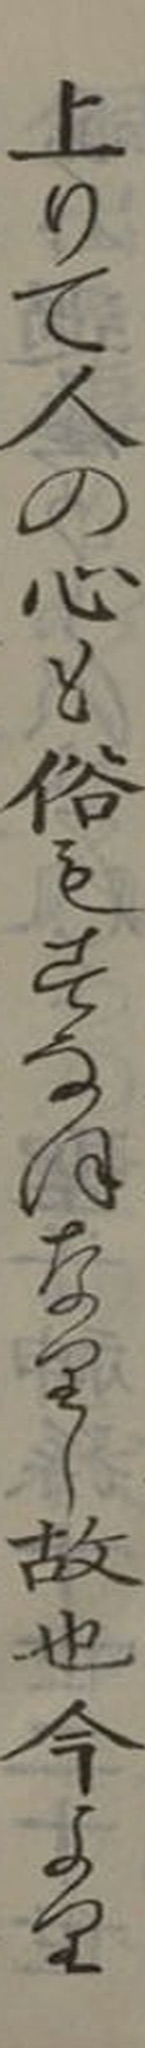上りて人の心も俗もすなほなりし故也今より
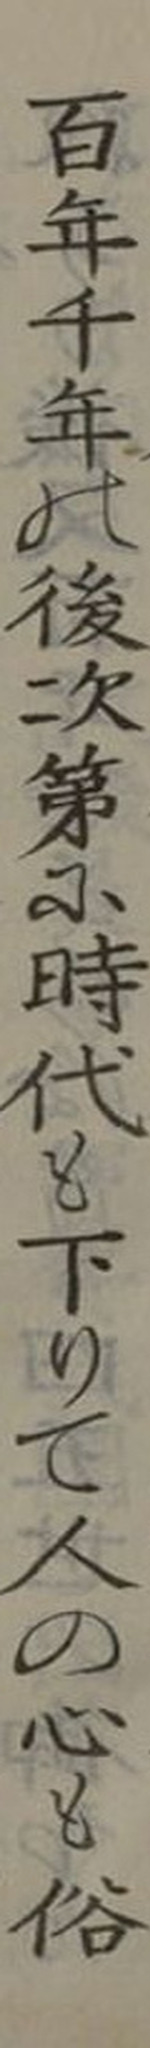百年千年の後次第に時代も下りて人の心も俗
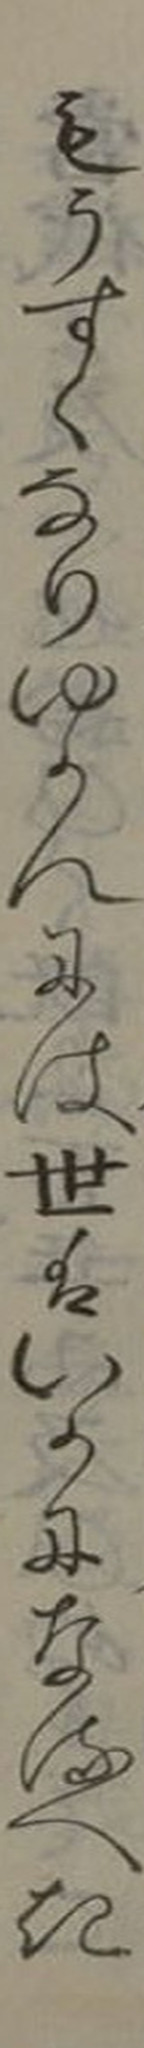もうすくなりゆかんには世はいかになるへき
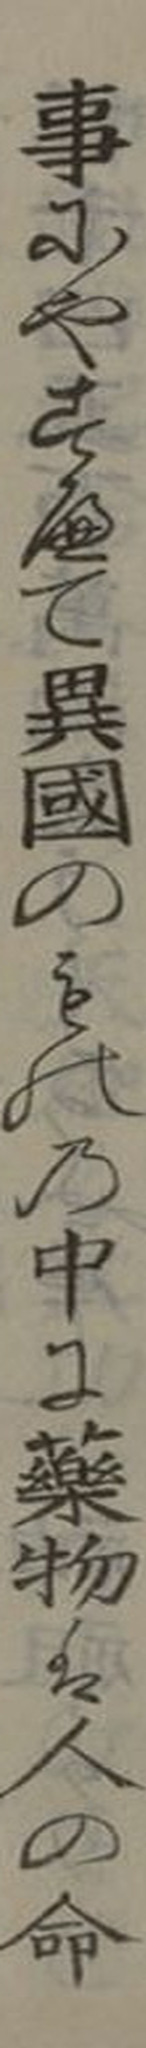事にやすへて異國のものの中に藥物は人の命
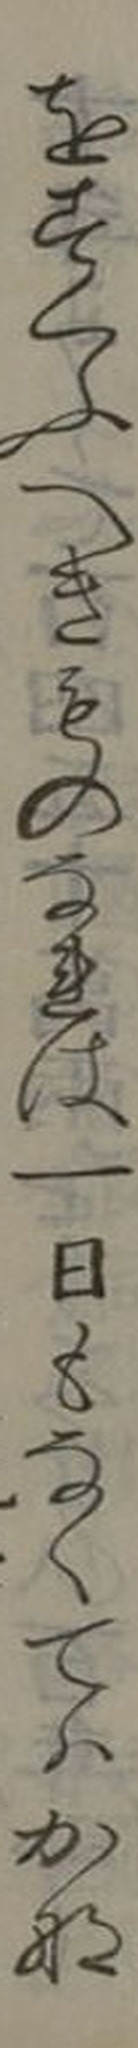をすくふへきものなれは一日もなくてはかな
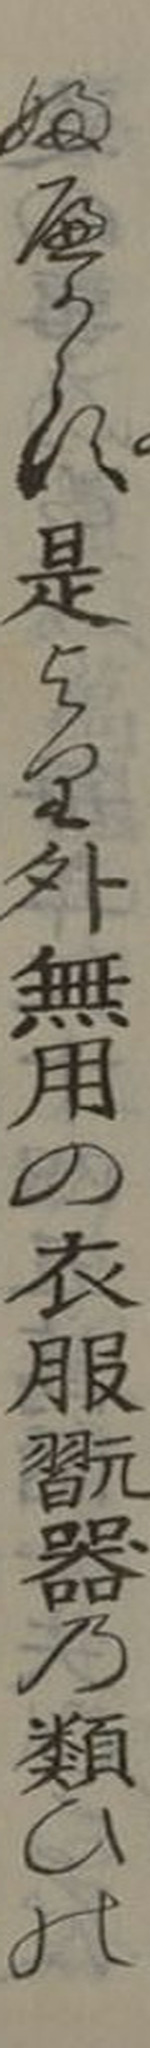ふへからす是より外無用の衣服翫器の類ひの
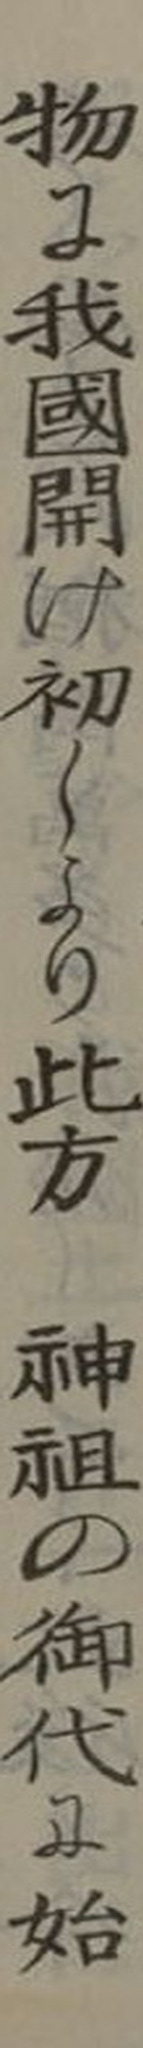物に我國開け初しより此方神祖の御代に始
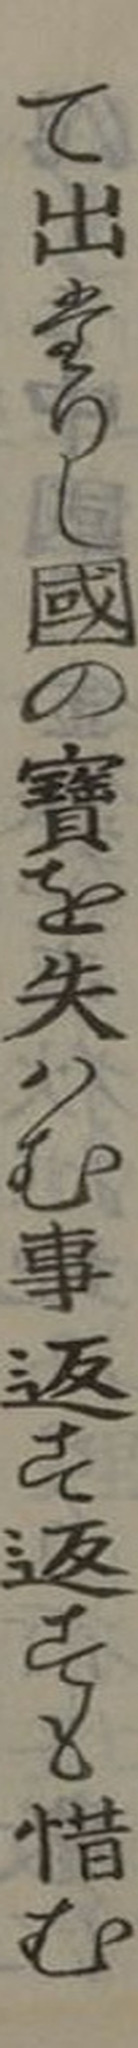て出たりし國の寶を失はむ事返す返すも惜む
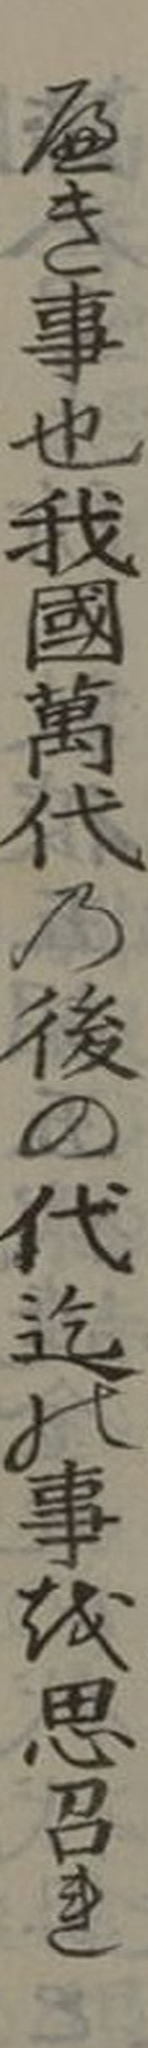へき事也我國萬代の後の代迄の事を思召れ
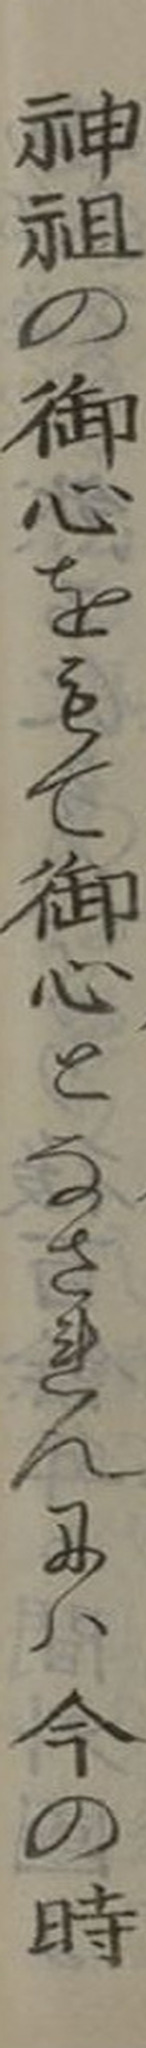神祖の御心をもて御心となされんには今の時
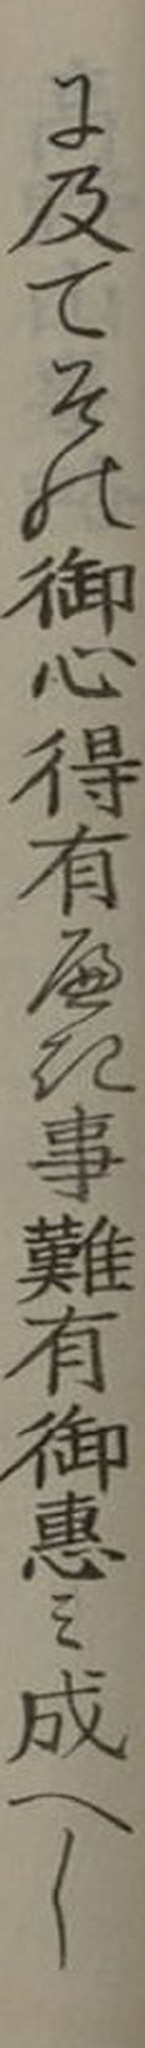に及てその御心得有へき事難有御惠み成へし
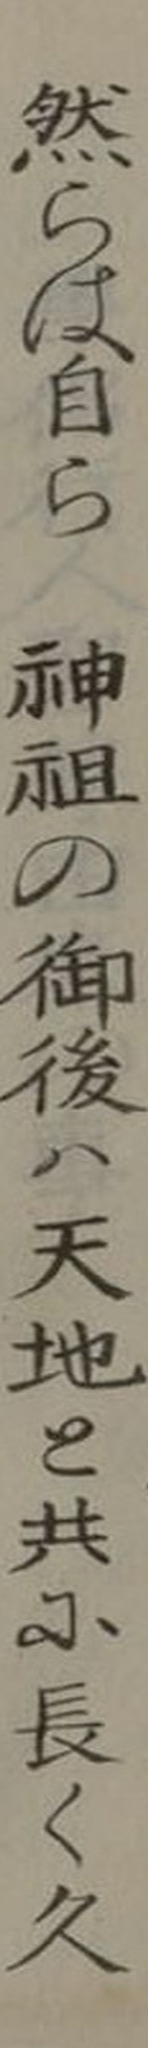然らは自ら神祖の御後は天地と共に長く久
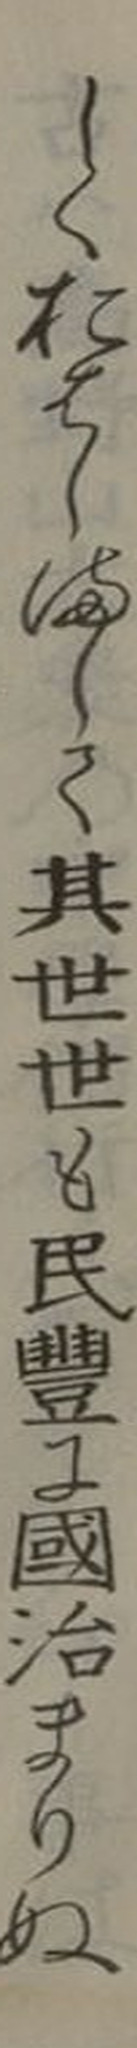しくおはしまして其世世も民豐に國治まりぬ
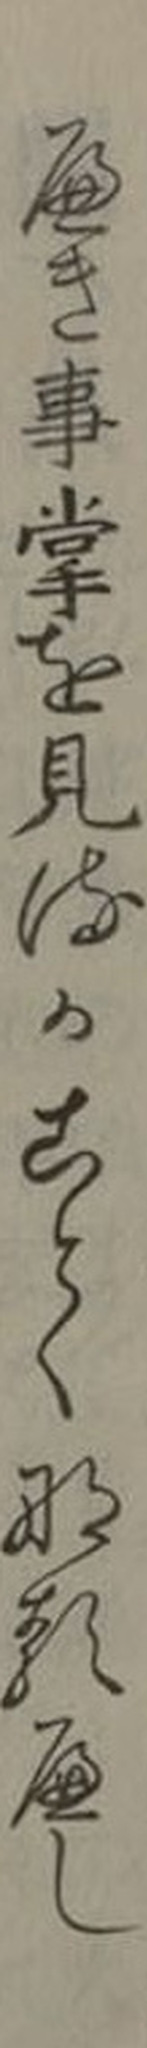へき事掌を見るかことくなるへし
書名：骨董録
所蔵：University of the Ryukyus Library
